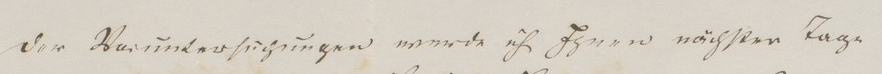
der Voruntersuchungen werde ich Ihnen nächster Tage
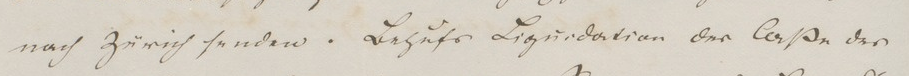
nach Zürich senden. Behufs Liquidation der Caße des
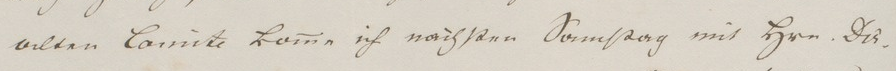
alten Comite komme ich nächsten Samstag mit Hrn. Dir.
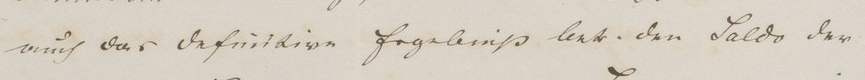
auch das definitive Ergebniß betr. den Saldo der
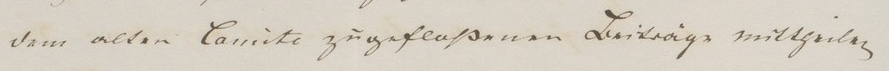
dem alten Comite zugefloßenen Beiträge mittheilen
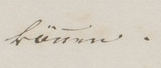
können.
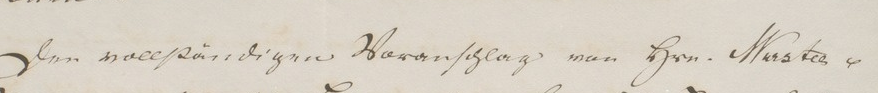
Den vollständigen Voranschlag von Hrn. Wurster &
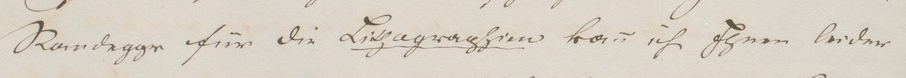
Randegger für die Lithographien kann ich Ihnen beider
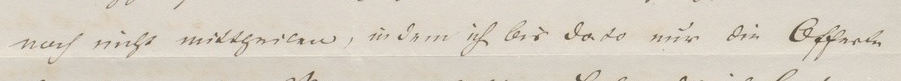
noch nicht mittheilen, indem ich bis dato nur die Offerte
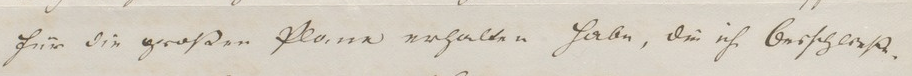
für die großen Plane erhalten habe, die ich beischließe.
